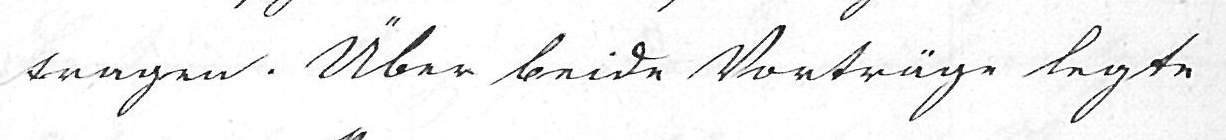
tragen. Über beide Vorträge legte
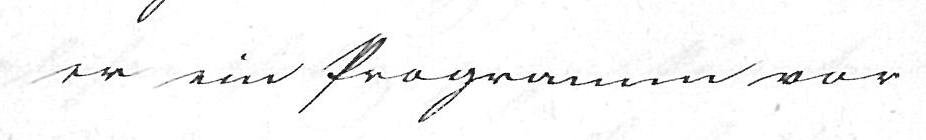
er ein Programm vor.
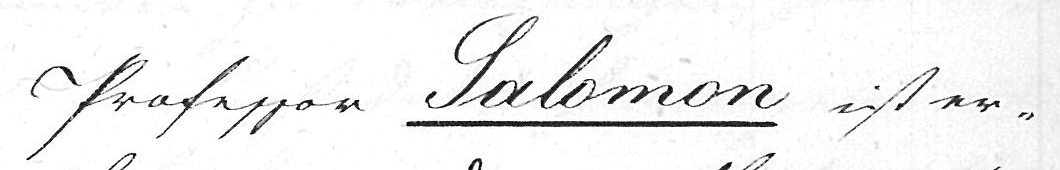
Professor Salomon ist er-
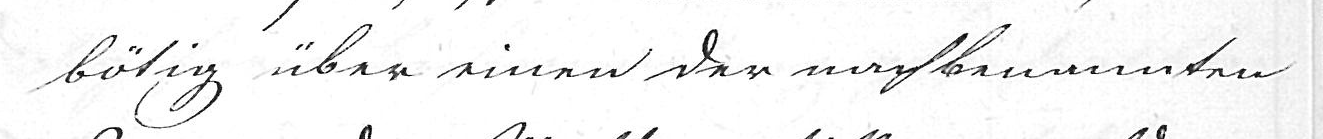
bötig über einen der nachbenannten
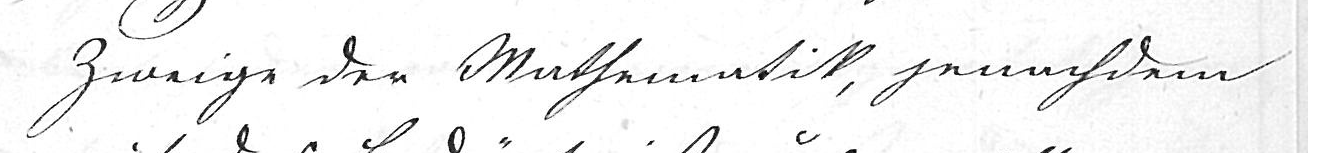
Zweige der Mathematik, jenachdem
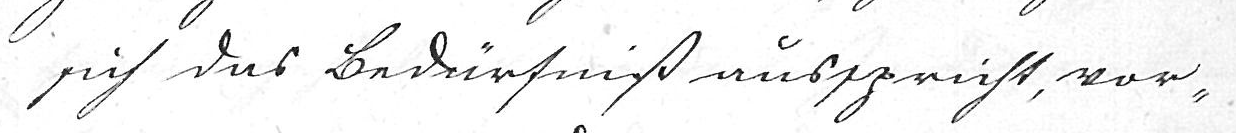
sich das Bedürfniß ausspricht, vor-
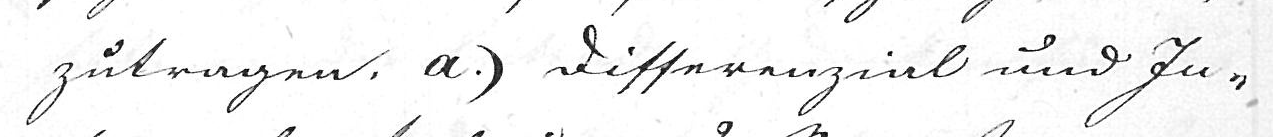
zutragen. a) Differenzial und In-
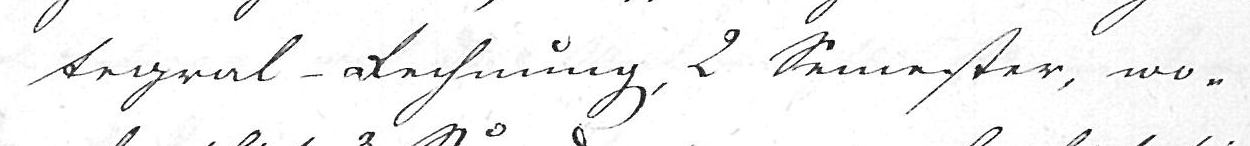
tegral-Rechnung, 2 Semester, wo-
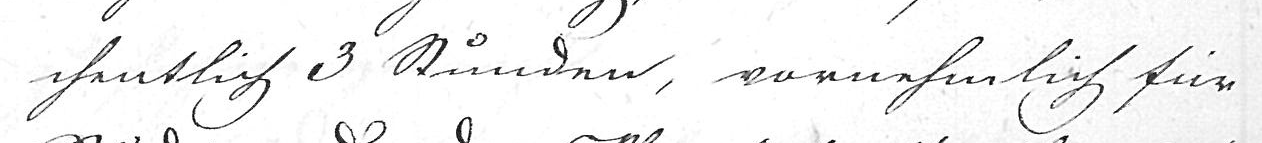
chentlich 3 Stunden, vornehmlich für
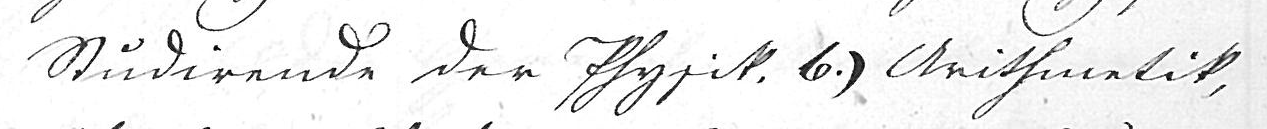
Studirende der Physik. b) Arithmetik,
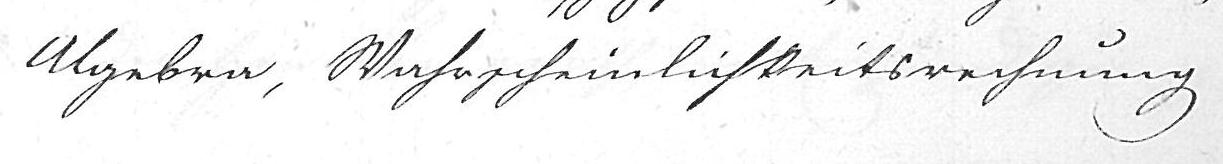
Algebra, Wahrscheinlichkeitsrechnung
